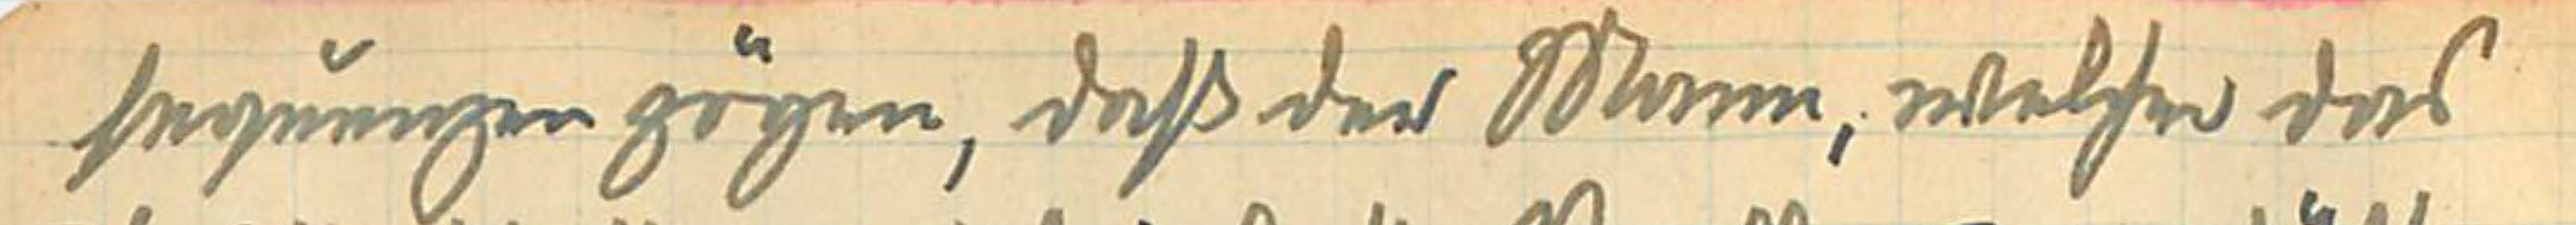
sequenzen zögen, daß der Mann, welcher das
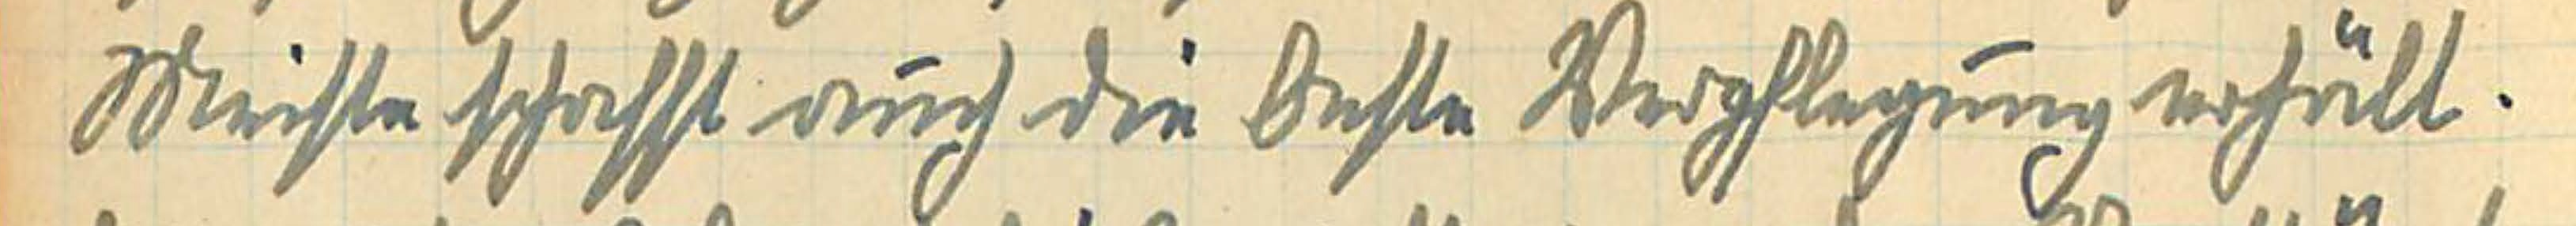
Meiste schafft auch die beste Verpflegung erhält.
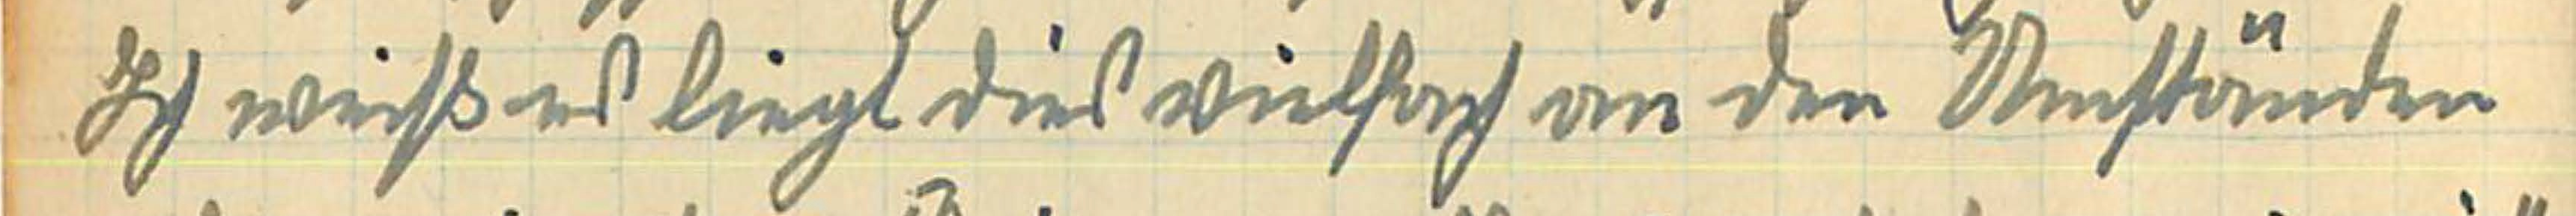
Ich weiß es liegt dies vielfach an den Umständen,
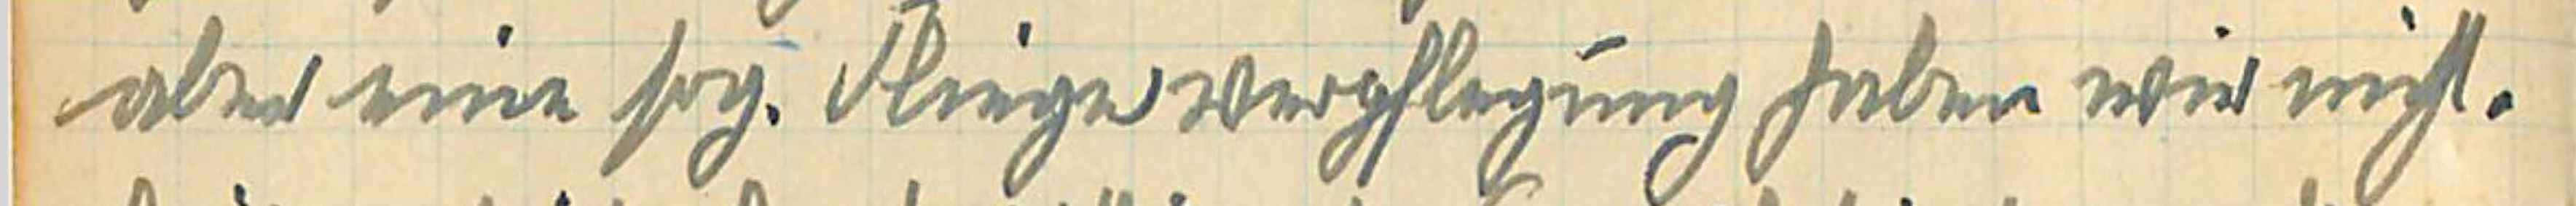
aber eine sog. Fliegerverpflegung haben wir nicht.
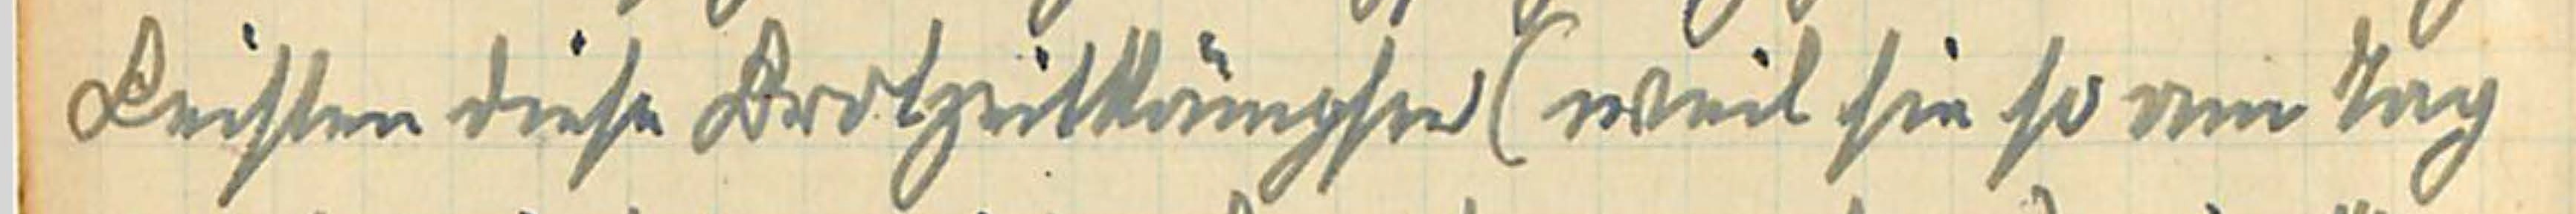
Leisten diese Brotzeitkämpfer (weil sie so am Tag
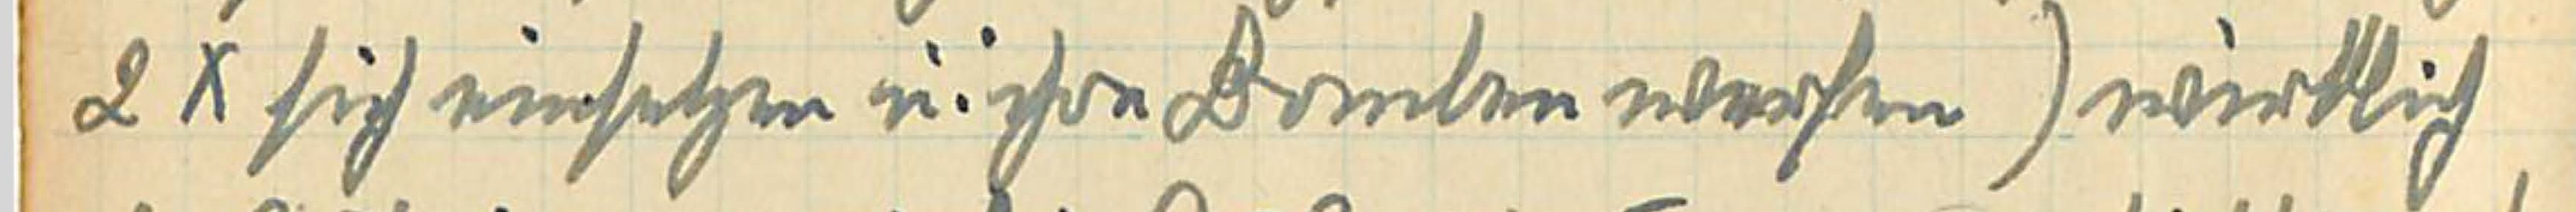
2 x sich einsetzen u. ihre Bomben werfen) wirklich
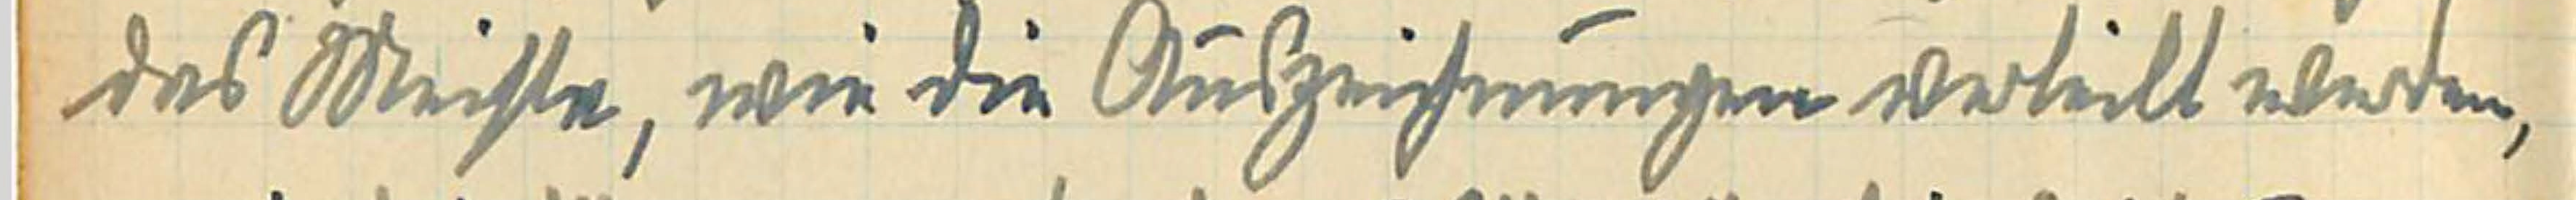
das Meiste, wie die Auszeichnungen verteilt werden
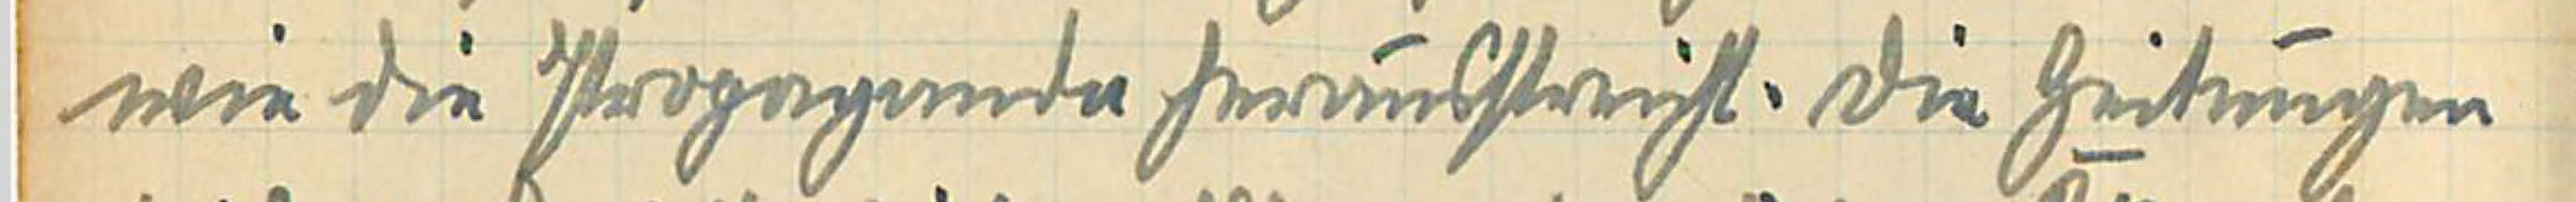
wie die Propaganda herausstreicht. Die Zeitungen
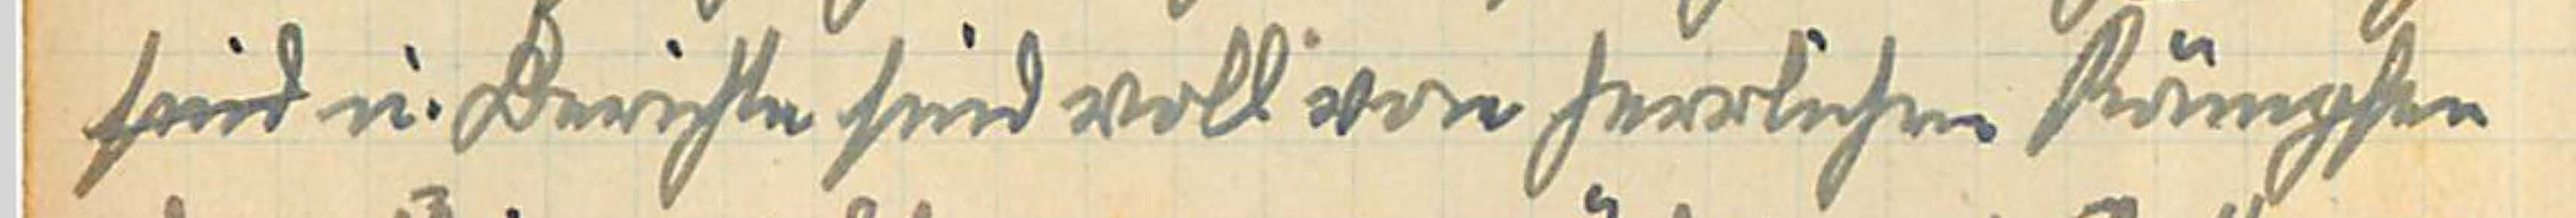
sind u. Berichte sind voll von herrlichen Kämpfen
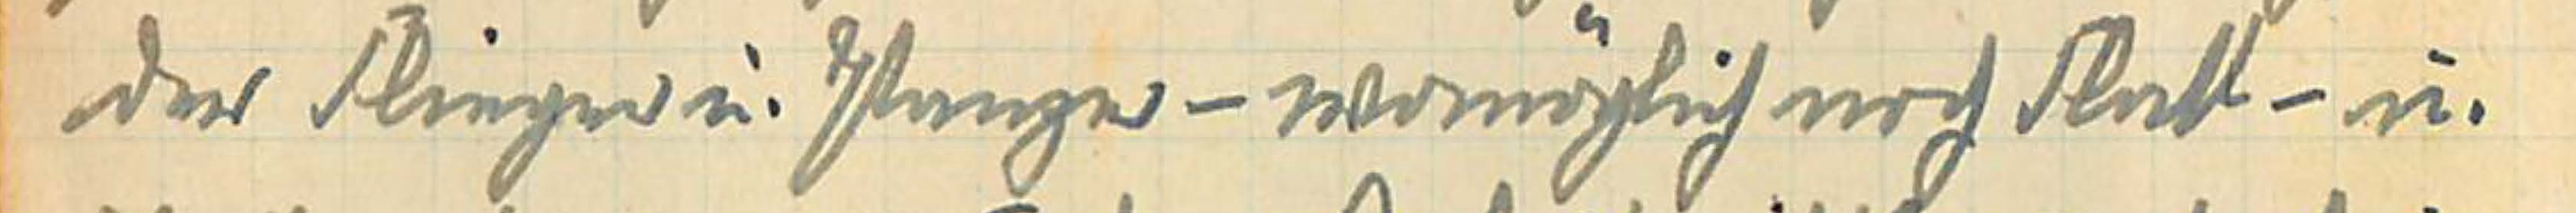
der Flieger u. Panzer – womöglich noch Flak – u.
